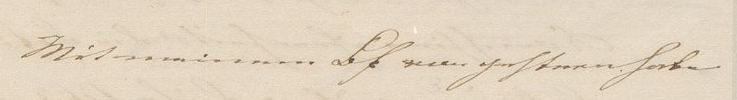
Mit meinem Bf von gestern habe
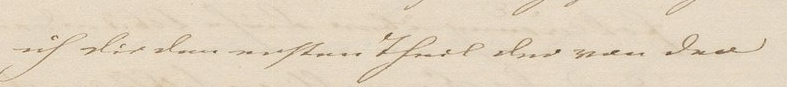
ich Dir den ersten Theil der von der
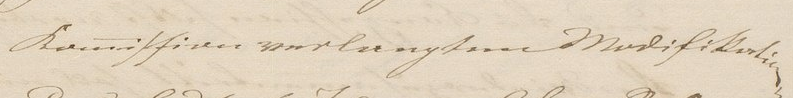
Kommission verlangten Modifikationen
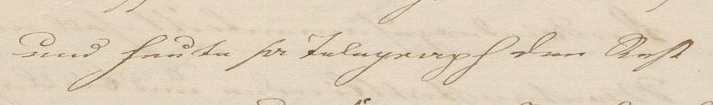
und heute per Telegraph den Rest
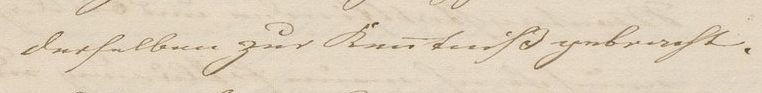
derselben zur Kenntniß gebracht.
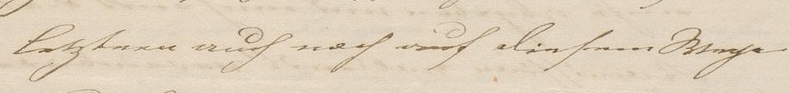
letztern auch noch auf diesem Wege
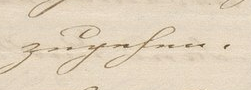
zugehen.
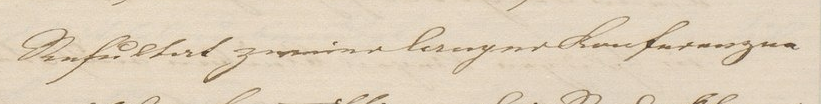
Resultat langer Konferenzen
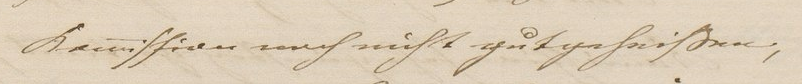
Kommission noch nicht gutgeheissen,
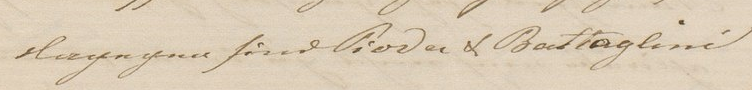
dagegen sind Pioda & Battaglini
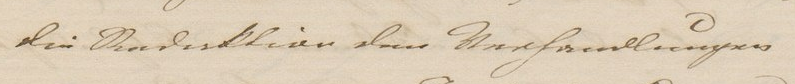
die Redaktion den Verhandlungen
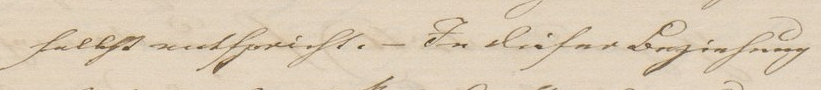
selbst entpricht. – In dieser Beziehung
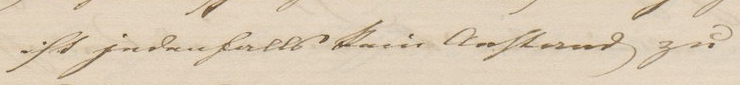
ist jedenfalls kein Anstand zu
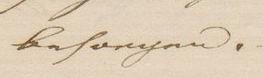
besorgen. –
